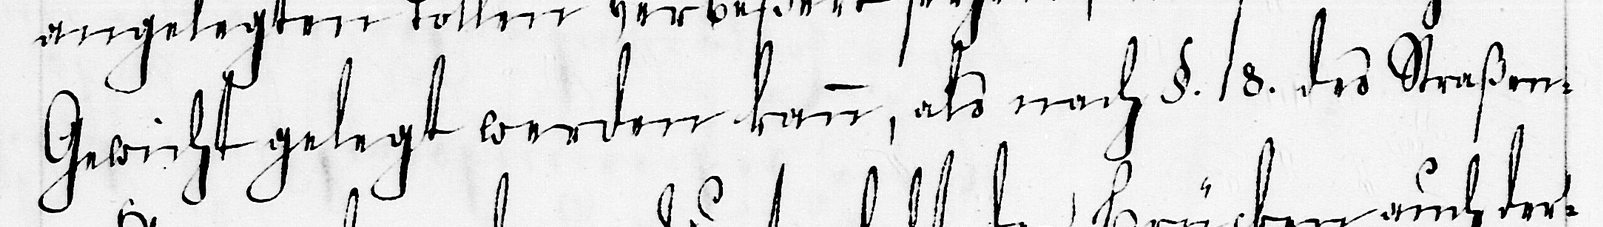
Gewicht gelegt werden kann, als nach §. 8. des Straßen¬
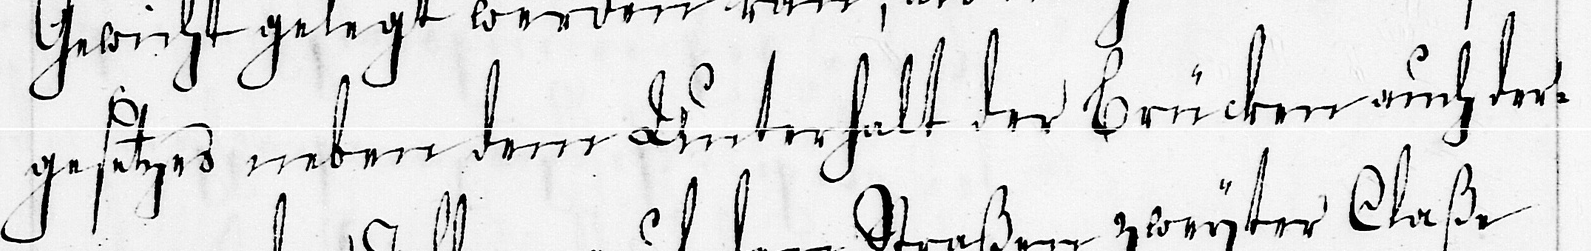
gesetzes neben dem Unterhalt der Brücken auch der¬
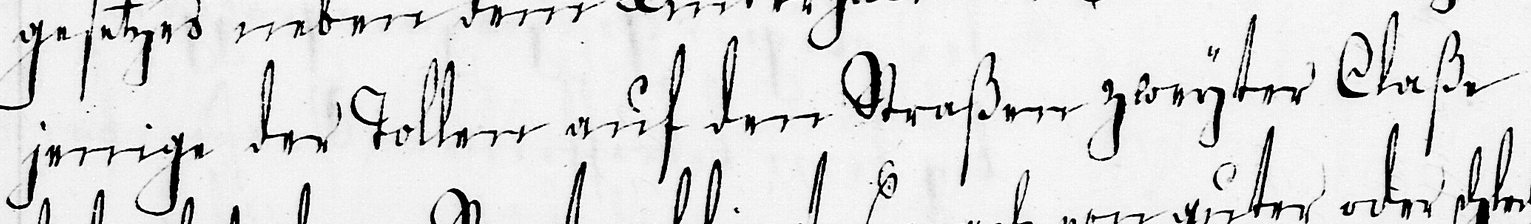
jenige der Tollen auf den Straßen zweyter Claße
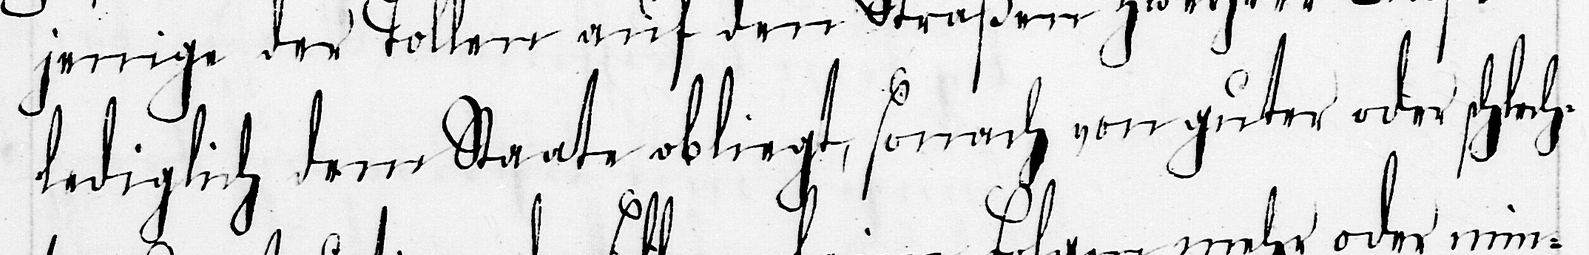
lediglich dem Staate obliegt, sonach von guter oder schle¬
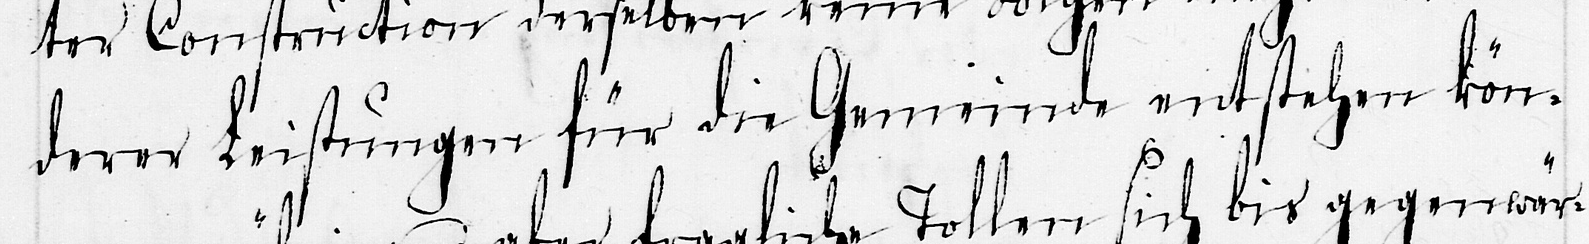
derer Leistungen für die Gemeinde entstehen kön¬
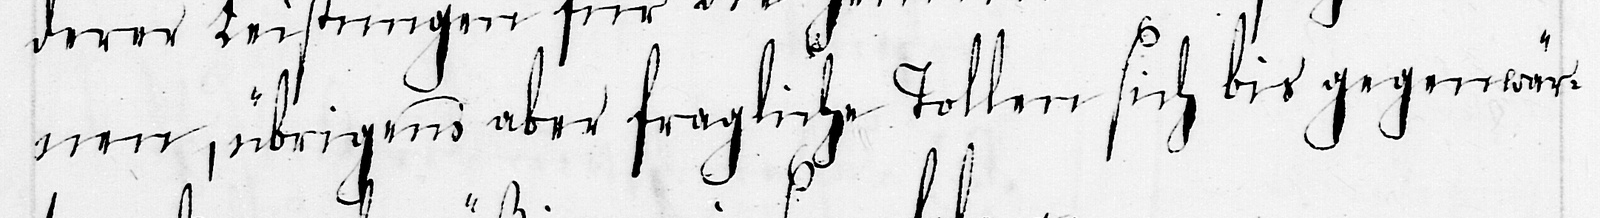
nen, übrigens aber fragliche Tollen sich bis gegenwär¬
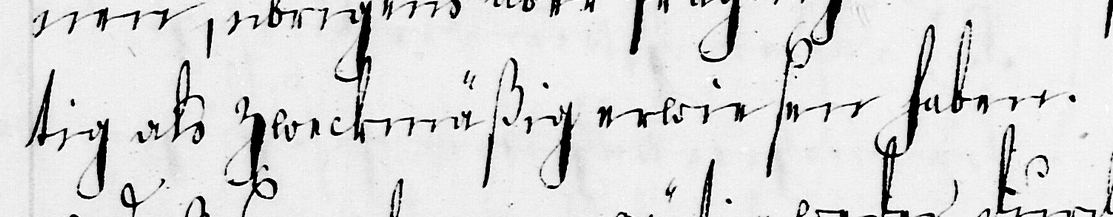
tig als zweckmäßig erwiesen haben.
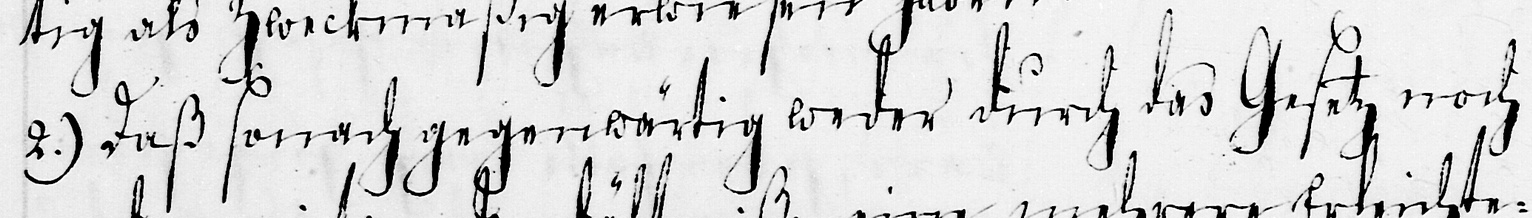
2.) Daß sonach gegenwärtig weder durch das Gesetz noch
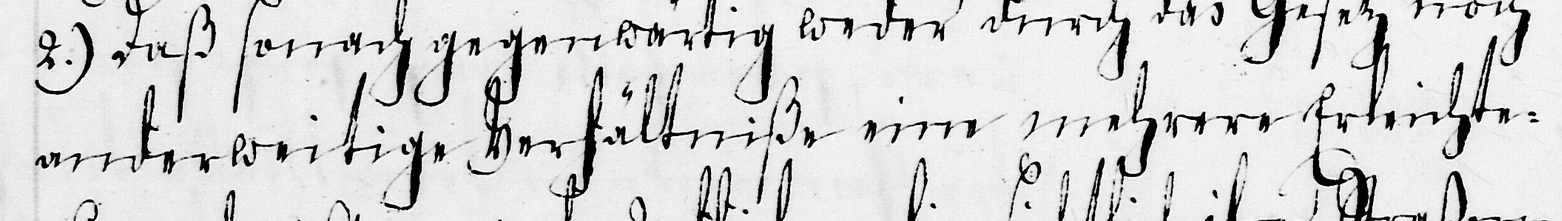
anderweitige Verhältniße eine mehrere Erleichte¬
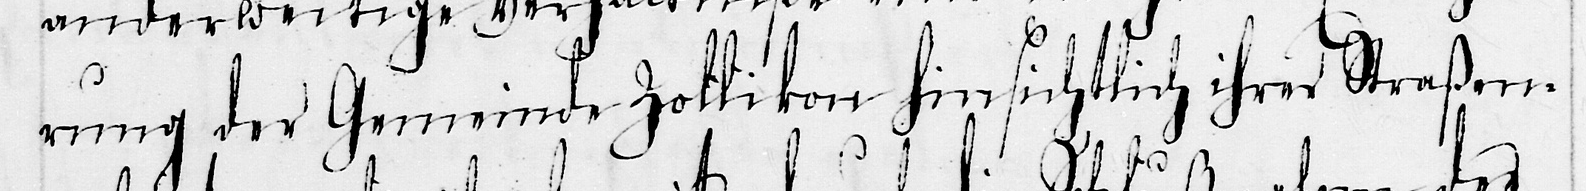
rung der Gemeinde Zollikon hinsichtlich ihrer Straßen¬
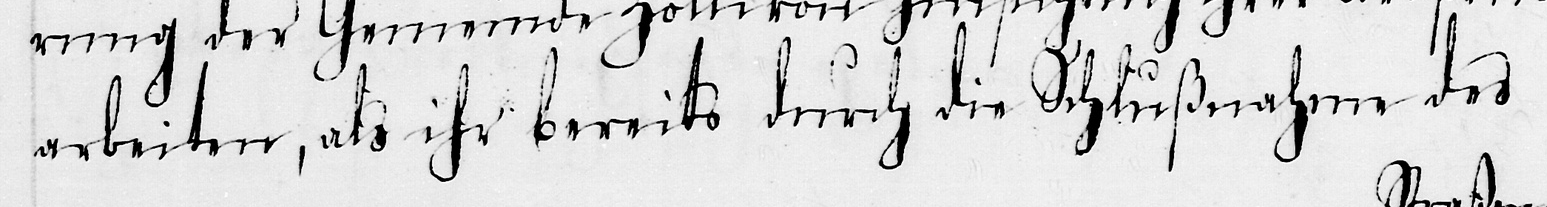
arbeiten, als ihr bereits durch die Schlußnahme des
